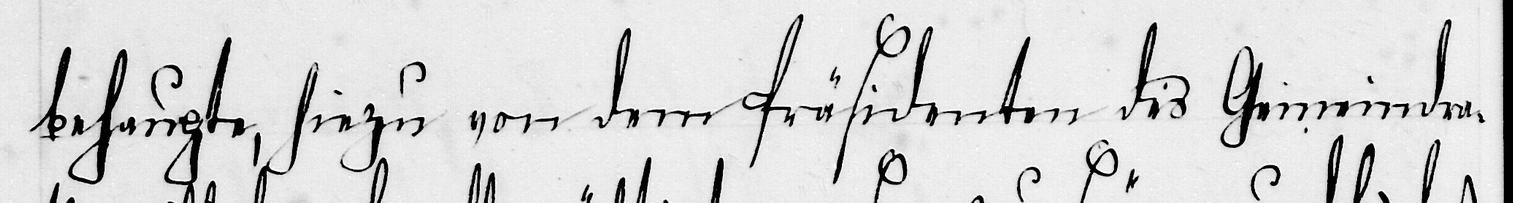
behaupte, hiezu von dem Präsidenten des Gemeindr¬
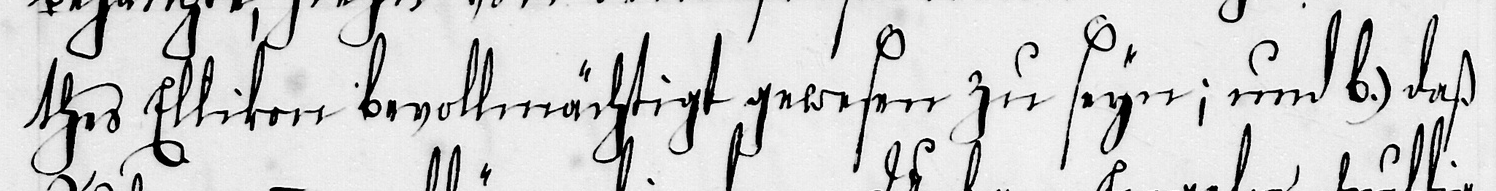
athes Ellikon bevollmächtigt gewesen zu seyn; und b.) daß
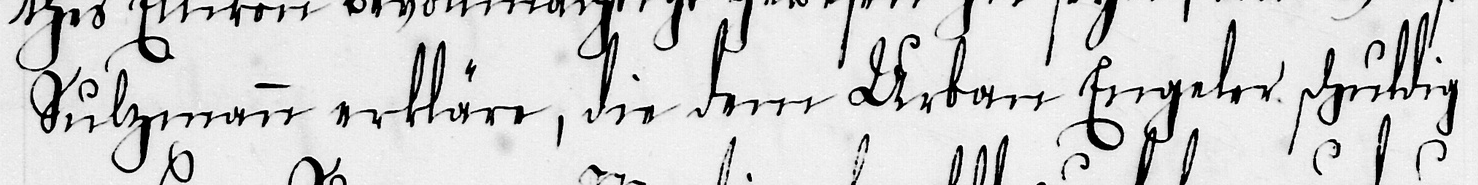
Sulzmann erkläre, die dem Urban Engeler schuldig
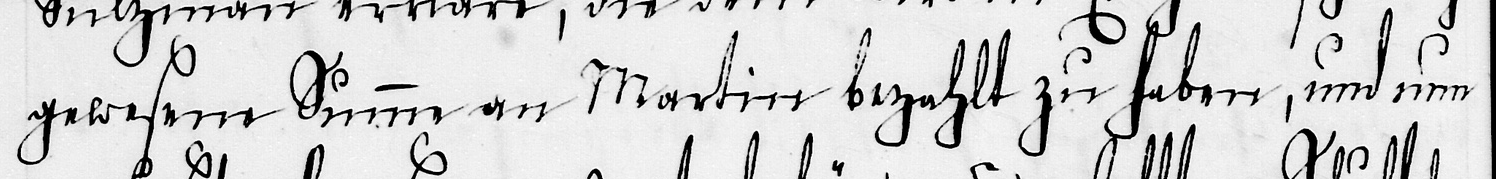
gewesene Summe an Martin bezahlt zu haben, und nun
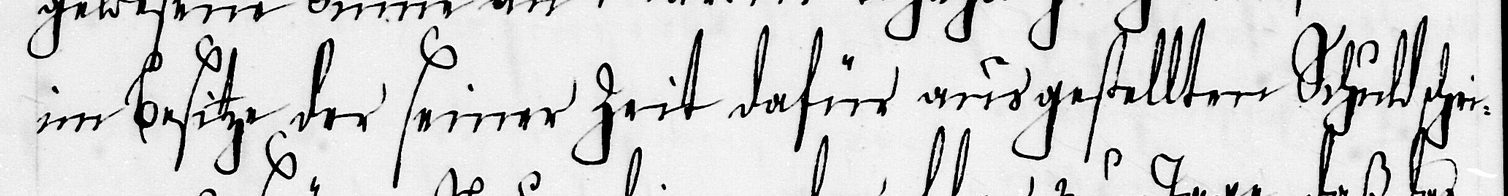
im Besitze der seiner Zeit dafür ausgestellten Schuldsc¬
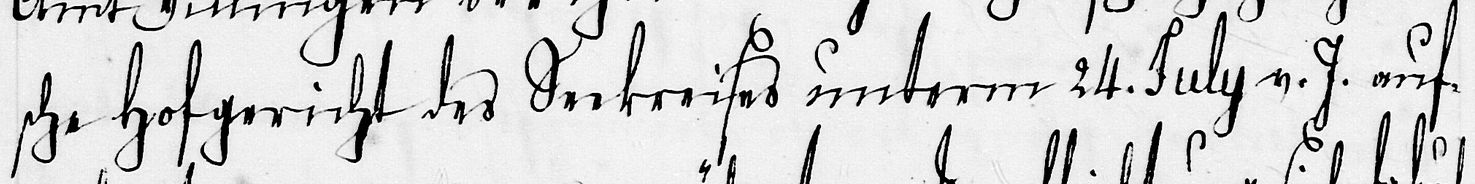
sche Hofgericht des Seekreises unterm 24. July v. J. auf¬
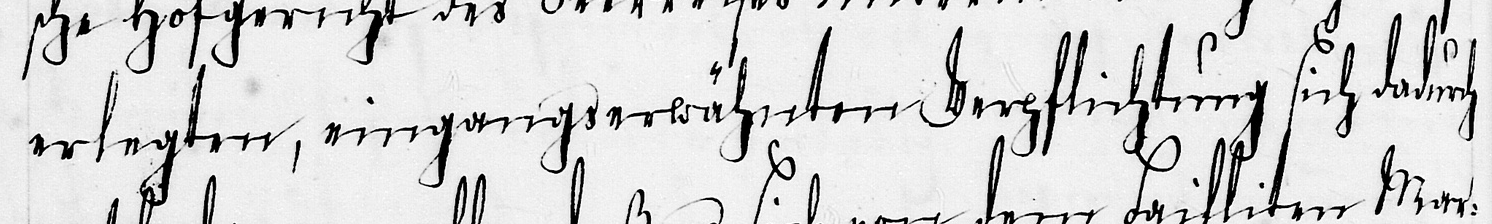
erlegten, eingangs erwähnten Verpflichtung sich dadu¬
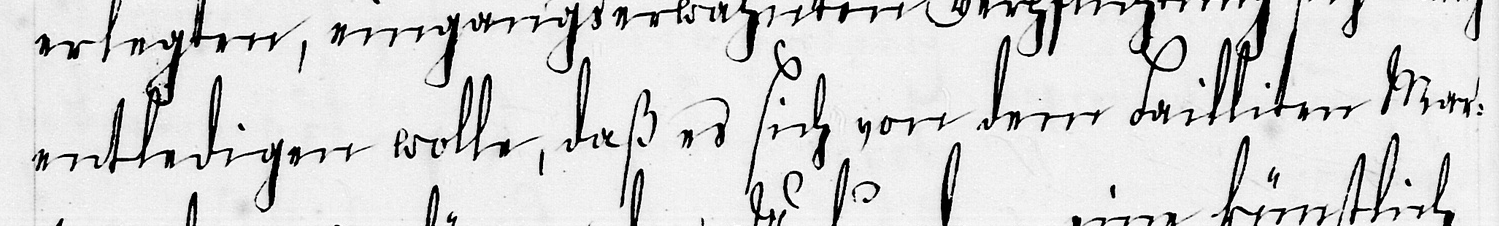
entledigen wolle, daß es sich von dem Failliten Mar¬
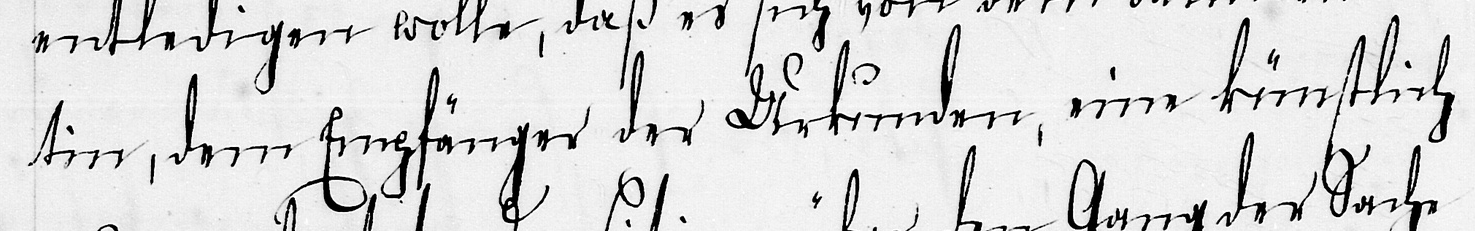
tin, dem Empfänger der Urkunden, eine künstlich
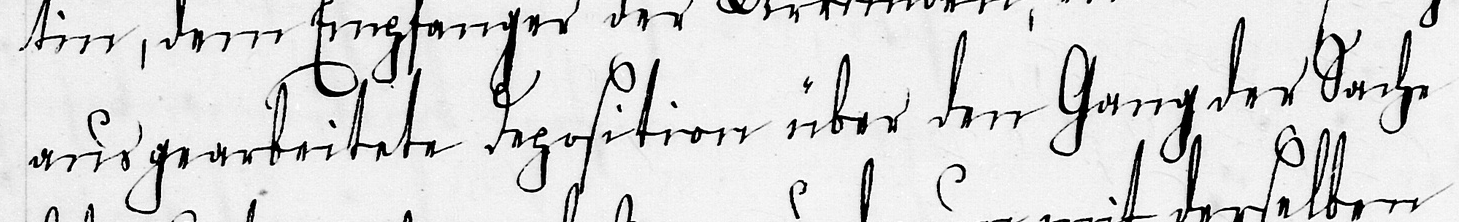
ausgearbeitete Deposition über den Gang der Sach¬
